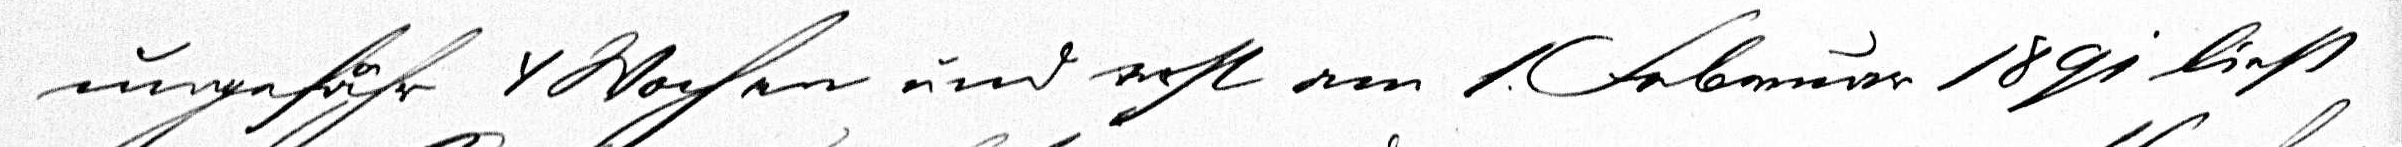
ungefähr 4 Wochen und erst am 1. Februar 1891 ließ
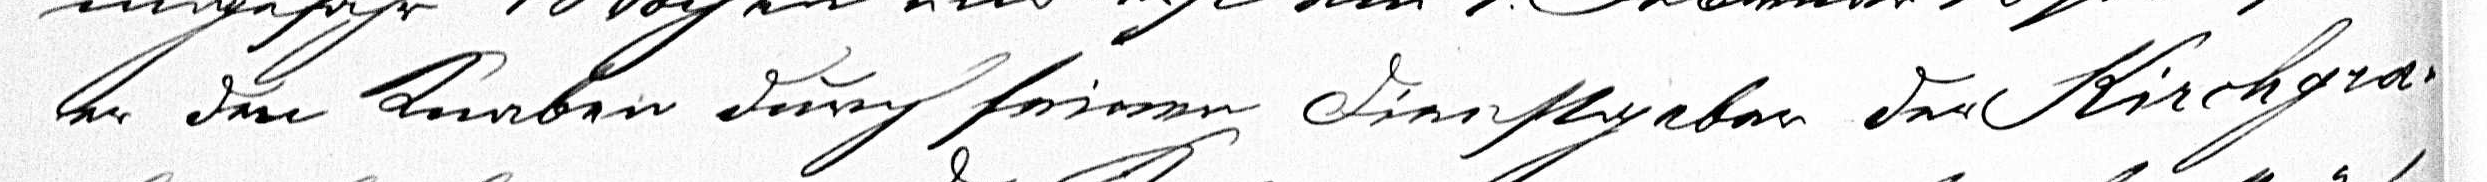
er den Knaben durch seinen Dienstgeber der Kirchgra¬
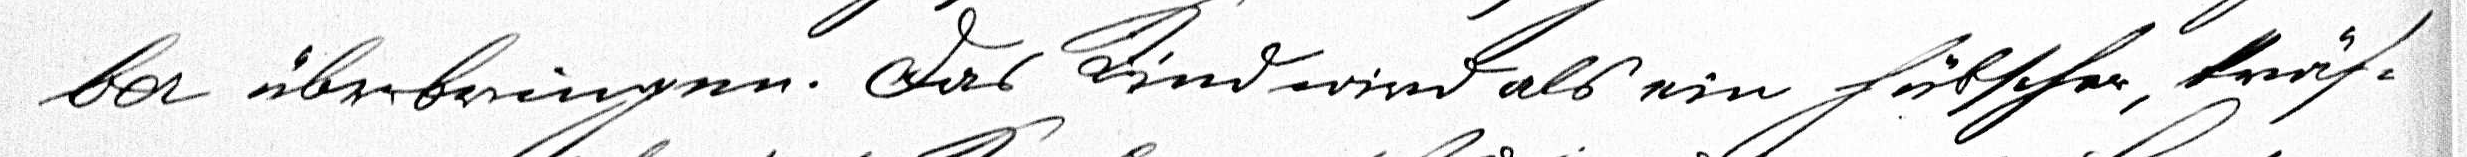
ber überbringen. Das Kind wird als ein hübscher, kräf¬
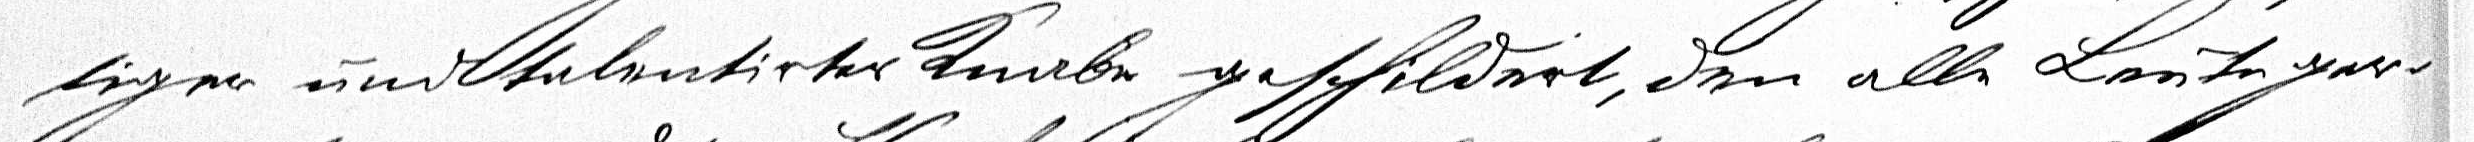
tiger und talentirter Knabe geschildert, den alle Leute ger¬
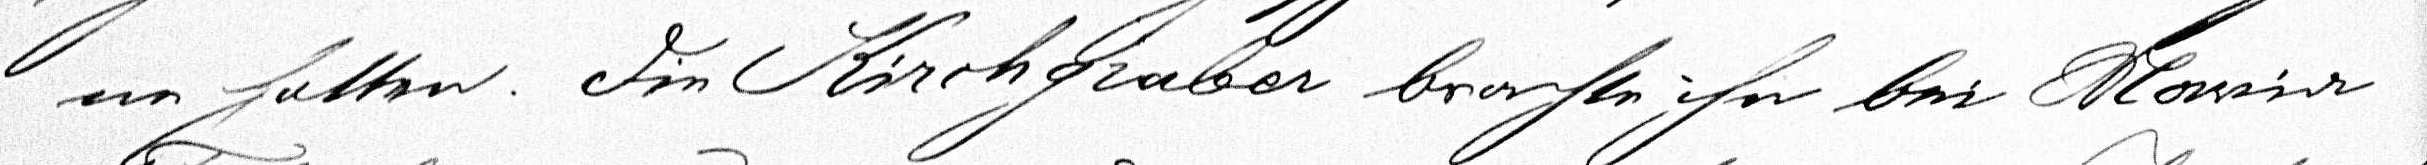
ne hatten. Die Kirchgraber brachte ihn bei Maria
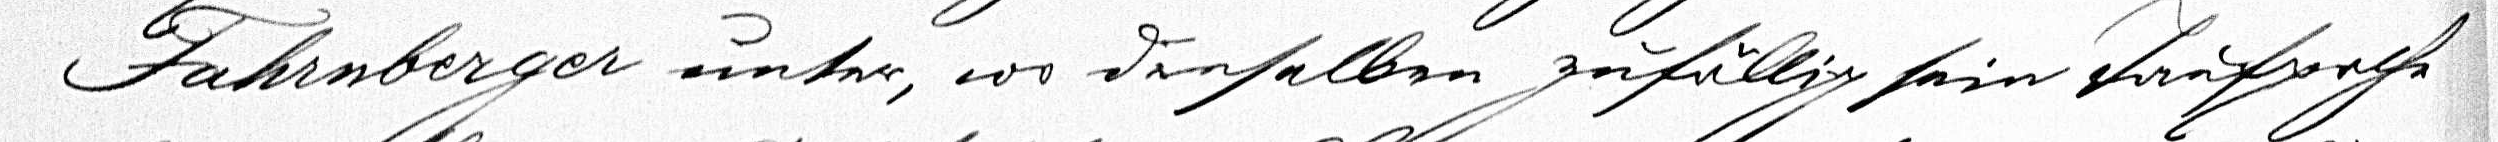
Fahrnberger unter, wo dieselben zufällig sein Taufpathe
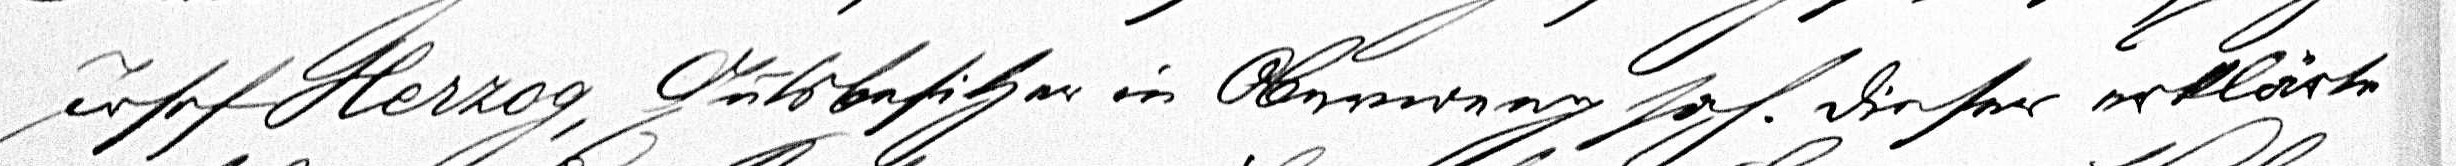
Josef Herzog, Gutsbesitzer in Oberweng sah. Dieser erklärte
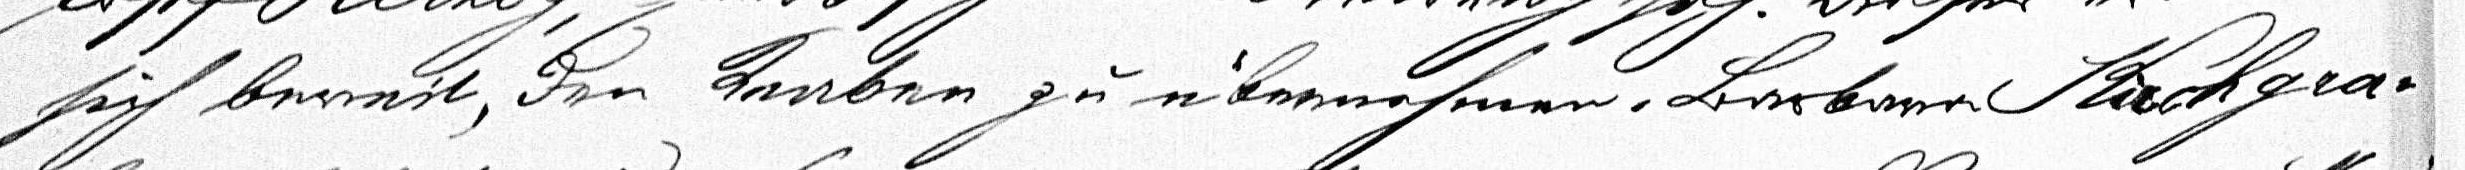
sich bereit, den Knaben zu übernehmen. Barbara Kirchgra¬
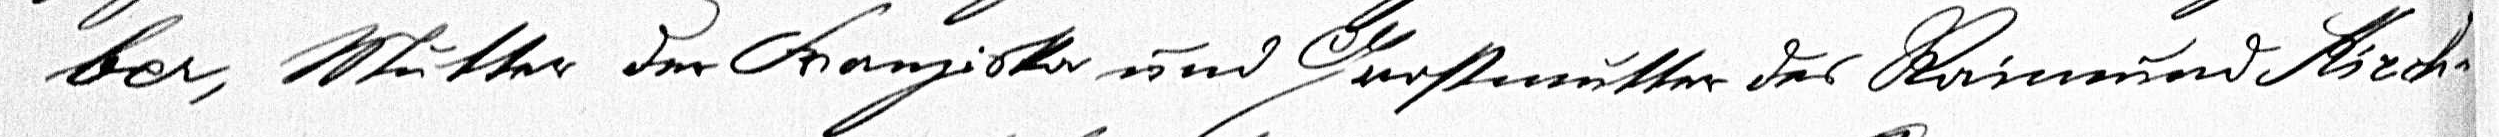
ber, Mutter der Franziska und Großmutter des Raimund Kirch¬
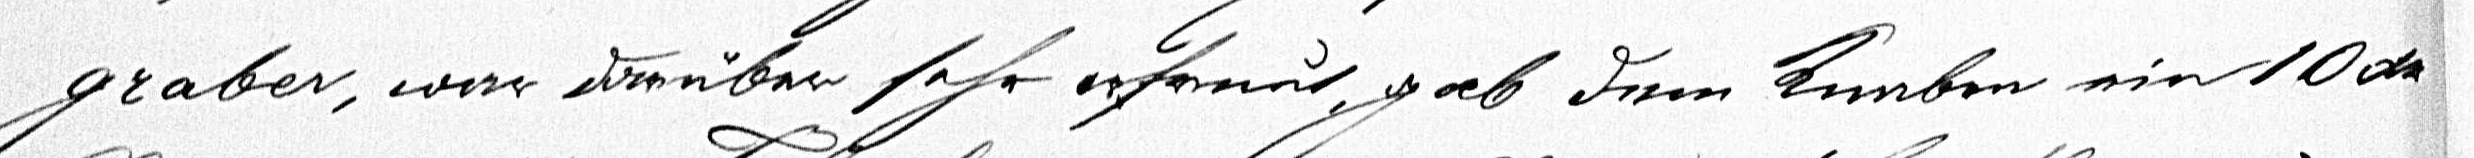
graber, war darüber sehr erfreut, gab dem Knaben ein 10 dr
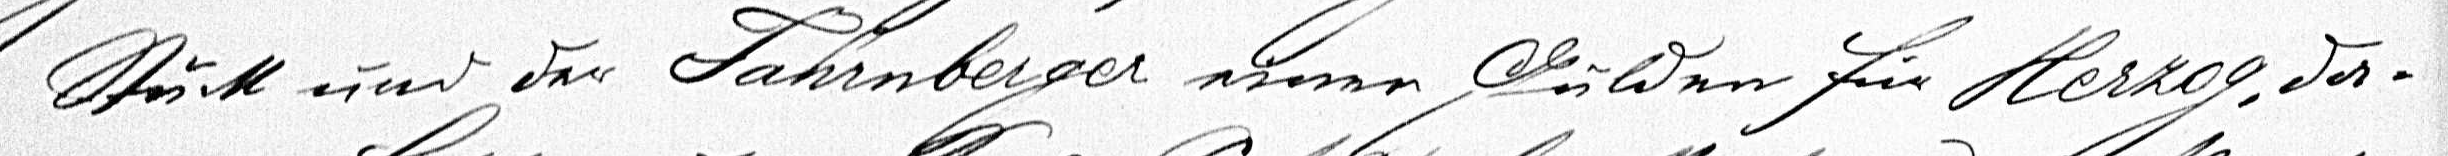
Stuck und der Fahrnberger einen Gulden für Herzog, da¬
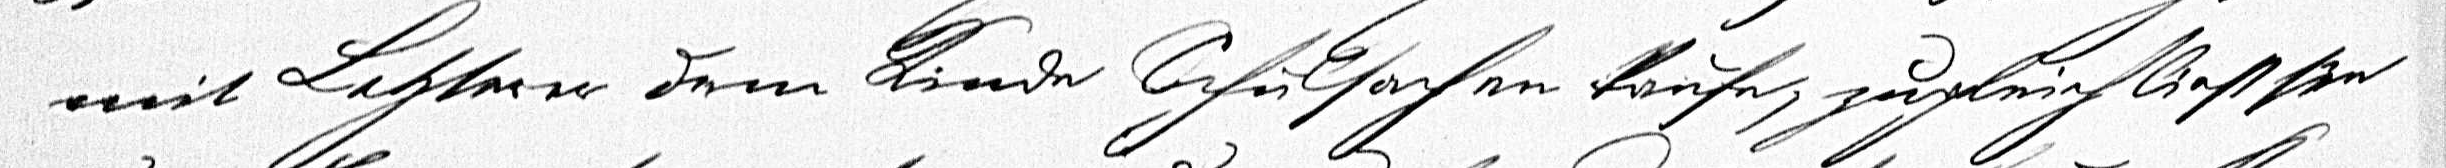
mit Letzterer dem Kinde Schulsachen kaufe, zugleich ließ sie
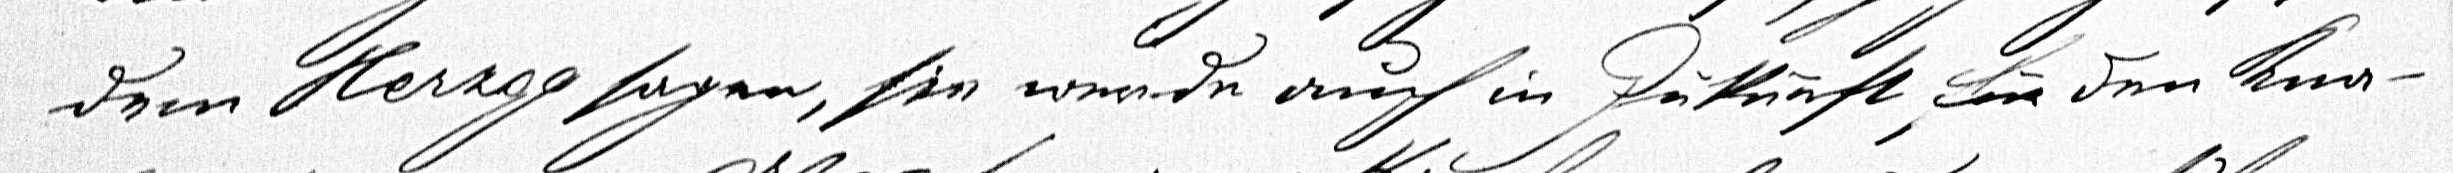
dem Herzog sagen, sie werde auch in Zukunft für den Kna¬
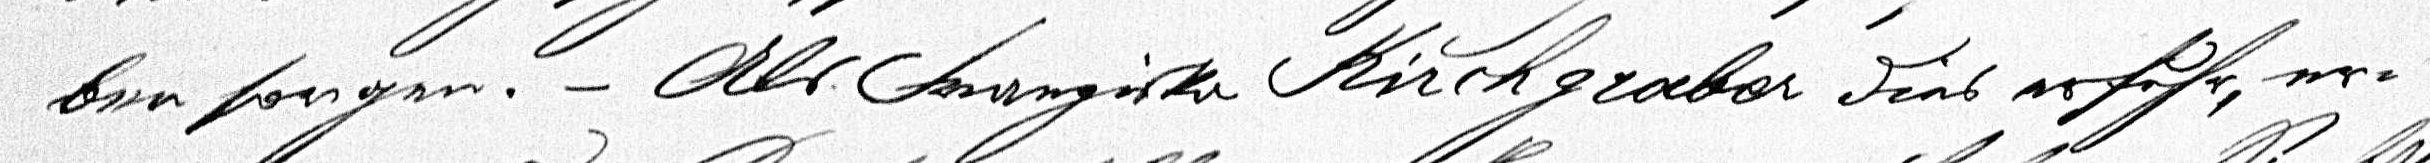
ben sorgen. Als Franziska Kirchgraber dies erfuhr, er¬
